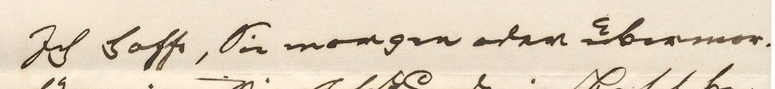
Ich hoffe, Sie morgen oder übermor-
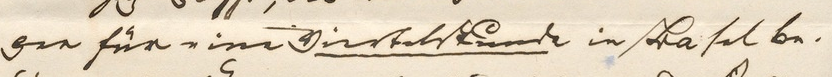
gen für eine Viertelstunde in Basel be-
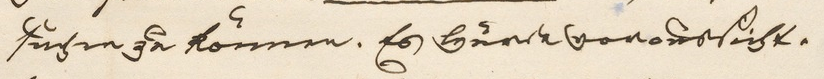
suchen zu können. Es würde voraussicht-
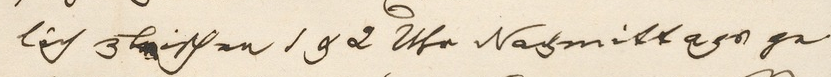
lich zwischen 1 & 2 Uhr Nachmittags ge-
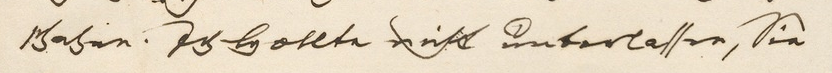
schehen. Ich wollte nicht unterlassen, Sie
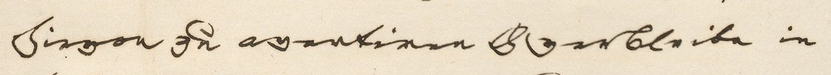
hievon zu avertiren & verbleibe in
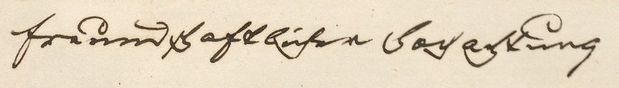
freundschaftlicher Hochachtung
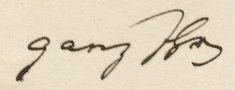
ganz Ihr
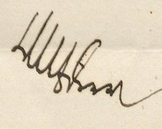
Escher
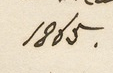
1865.
